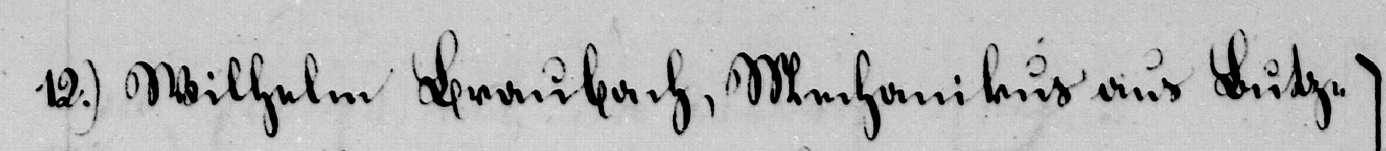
12.) Wilhelm Braubach, Mechanikus aus Butz¬
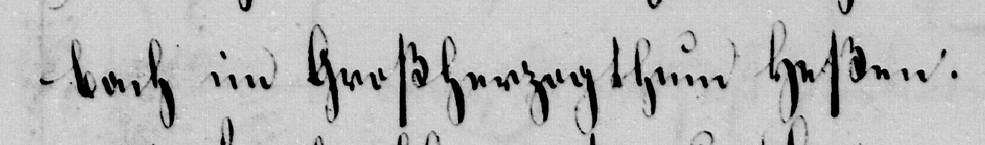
bach im Großherzogthum Heßen.
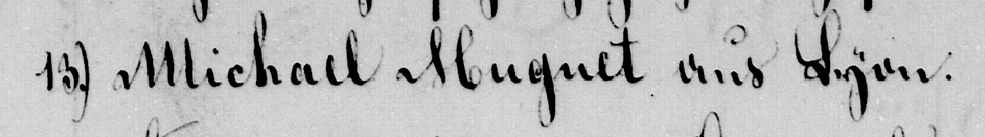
13.) Michael Muguet aus Lyon.
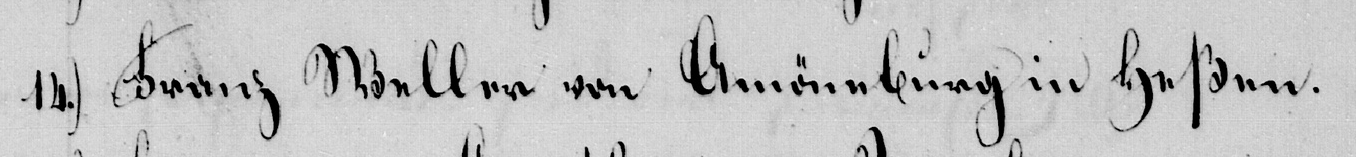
14.) Franz Meller von Amönnburg in Heßen.
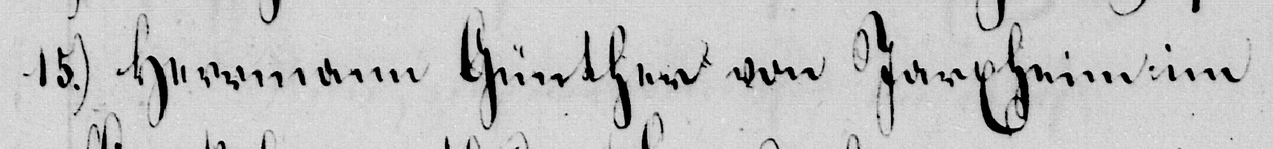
15.) Herrmann Günther von Jarpheim im
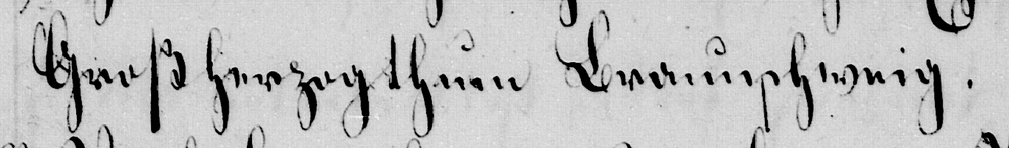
Großherzogthum Braunschweig.
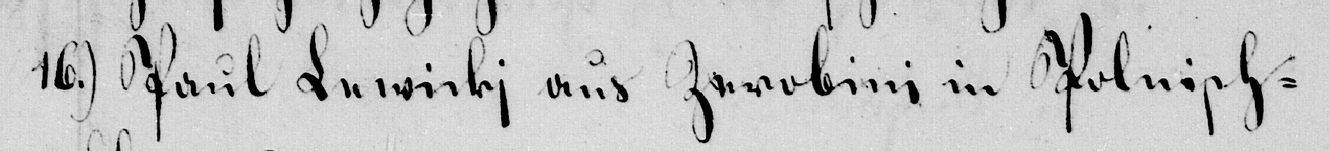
16.) Paul Luwicki aus Zerobini in Polnisch-L¬
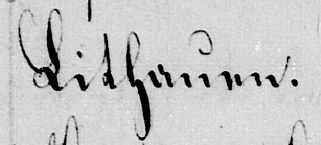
ithauen.
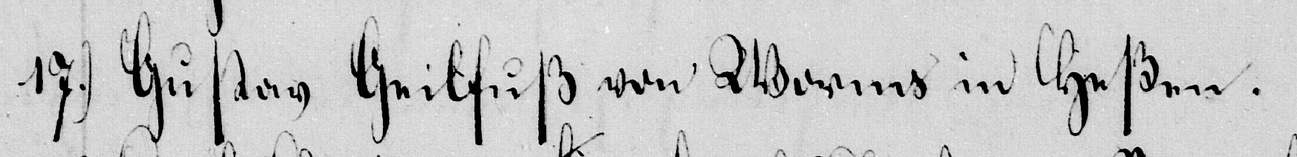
17.) Gustav Grilfuß von Worms in Heßen.
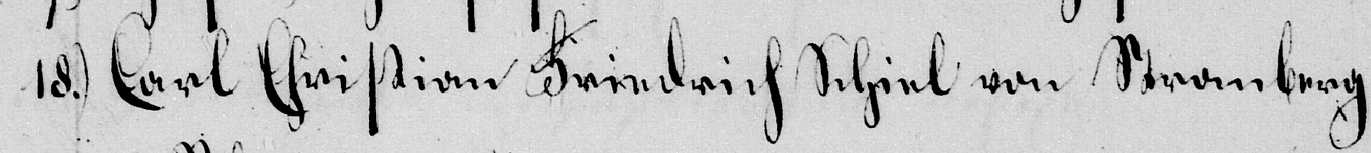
18.) Carl Christian Friedrich Schiel von Stramberg
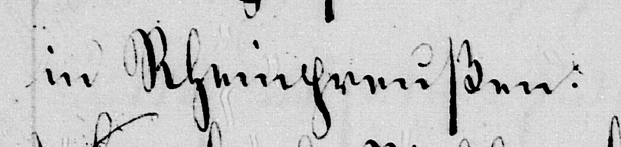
in Rheinpreußen.
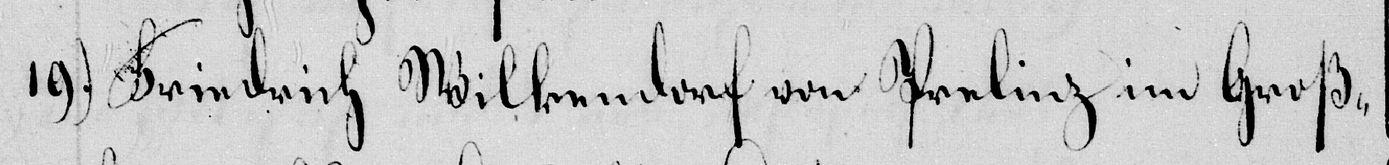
19.) Friedrich Wilkendorf von Prelinz im Groß¬
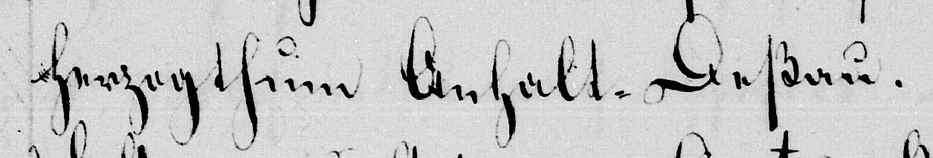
herzogthum Anhalt-Deßau.
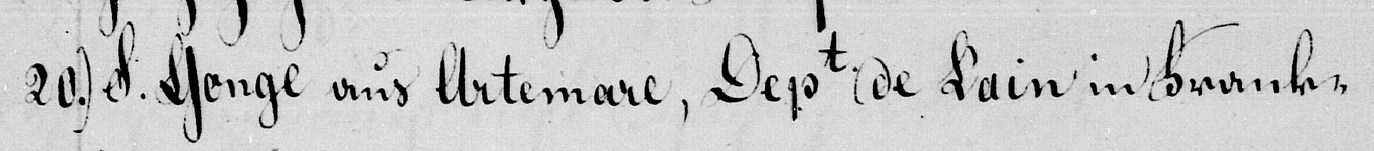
20.) S. Gonge aus Artemarc, Dept. de L’ain in Frank¬
